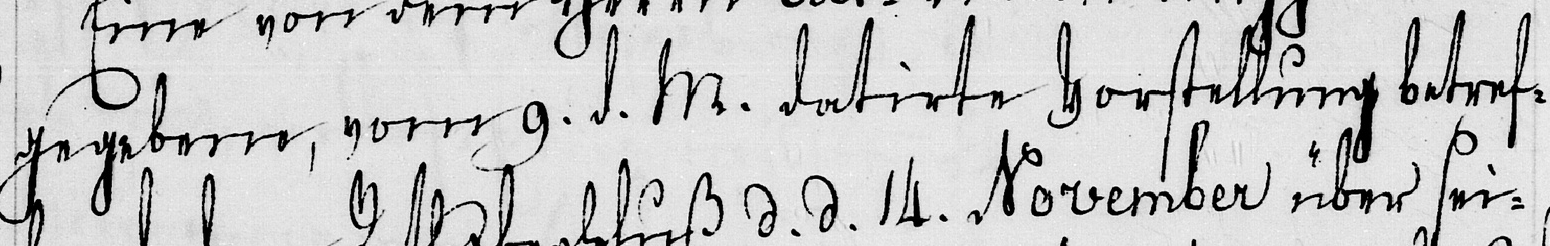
gegebene, vom 9. d. M. datirte Vorstellung betref¬
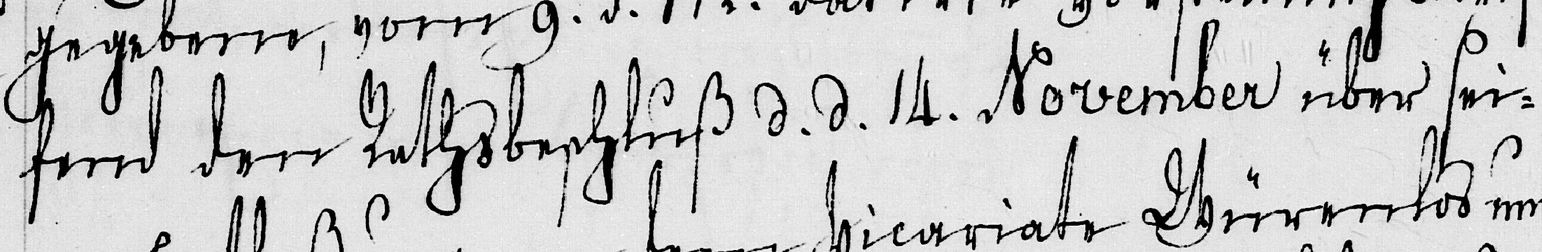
fend den Rathsbeschluß d. d. 14. November über sei¬
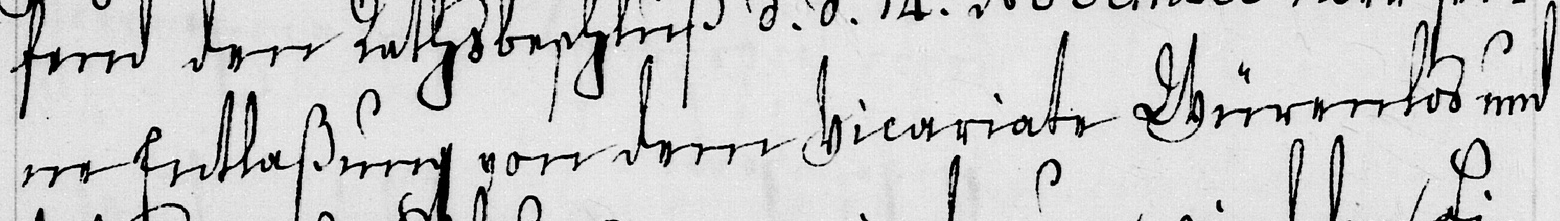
ne Entlaßung von dem Vicariate Würenlos und
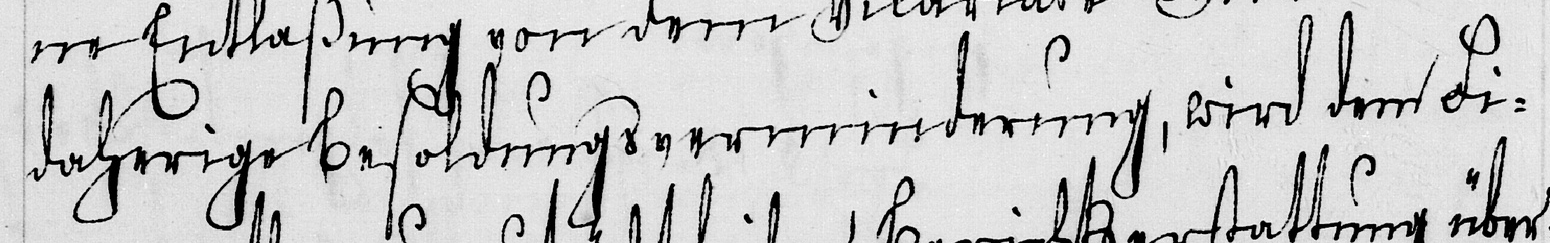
daherige Besoldungsverminderung, wird dem Fi¬
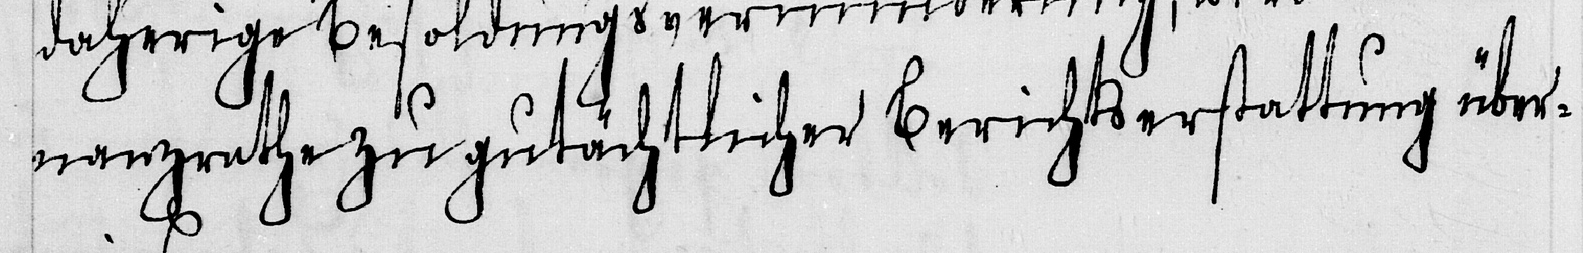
nanzrathe zu gutächtlicher Berichterstattung über¬
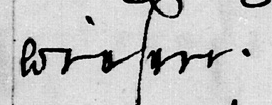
wiesen.
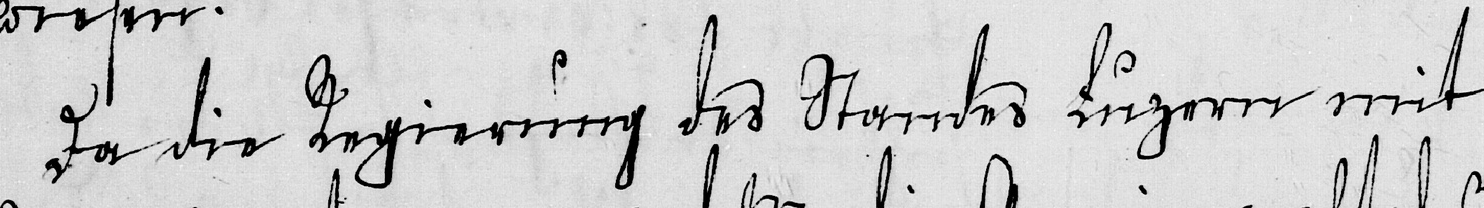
Da die Regierung des Standes Luzern mit
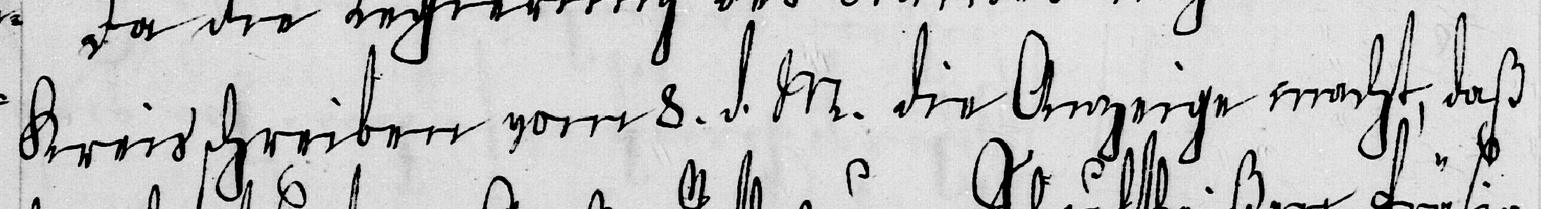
Kreisschreiben vom 8. d. M. die Anzeige macht, daß
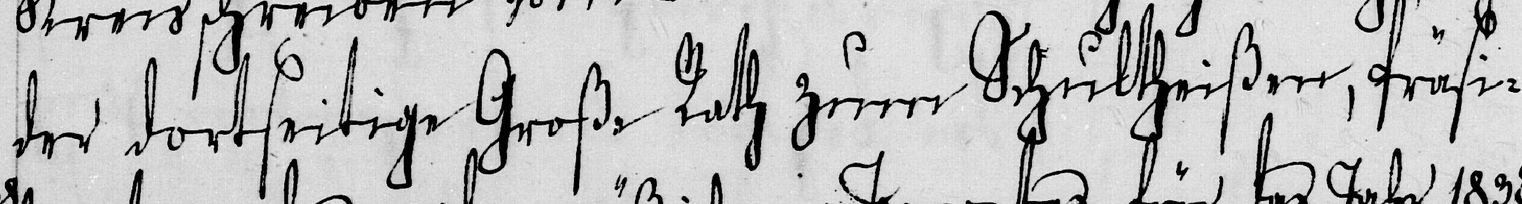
der dortseitige Große Rath zum Schultheißen, Präsi¬
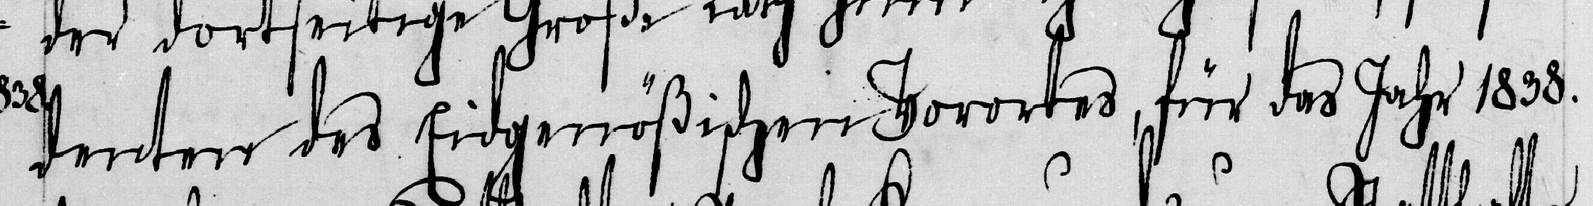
denten des Eidgenößischen Vorortes, für das Jahr 1838.
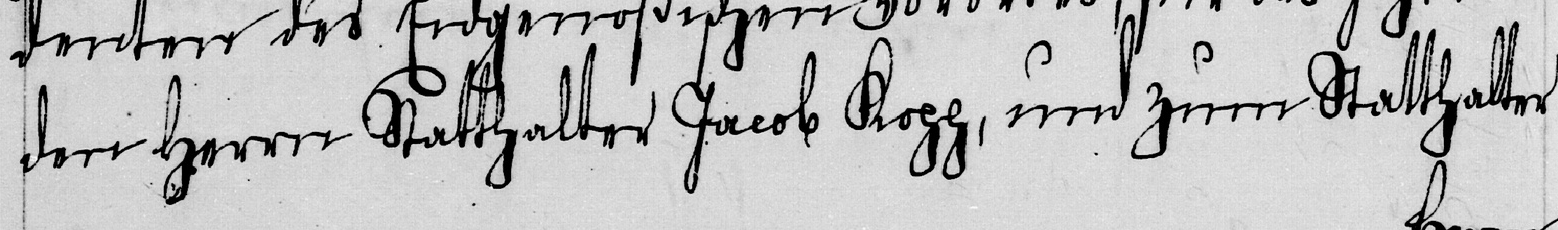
den Herrn Statthalter Jacob Kopp, und zum Statthalter
